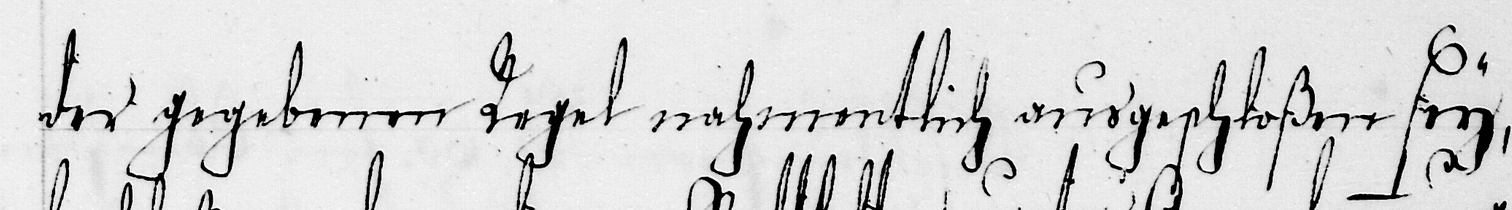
der gegebenen Regel nahmentlich ausgeschloßen sey,
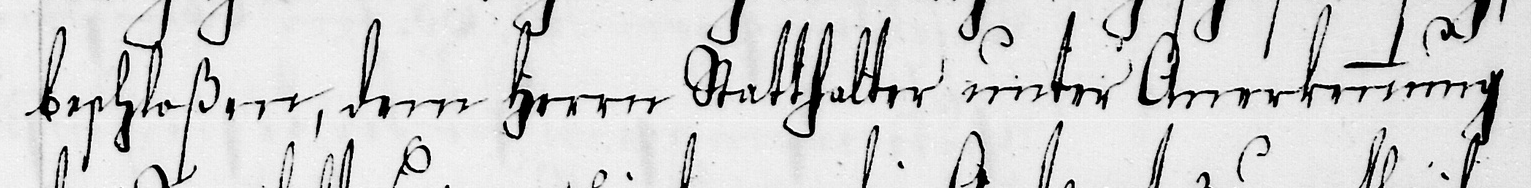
beschloßen, dem Herrn Statthalter unter Anerkennung
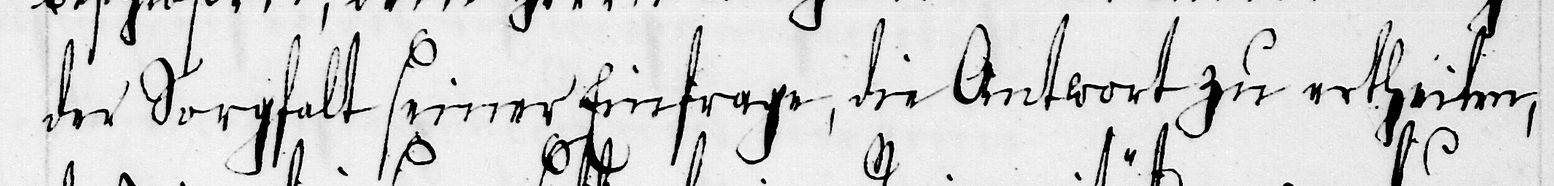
der Sorgfalt seiner Einfrage, die Antwort zu ertheilen,
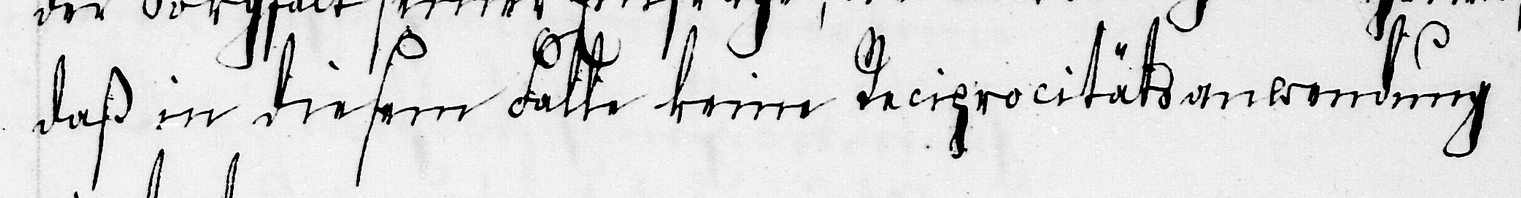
daß in diesem Falle keine Reciprocitätsanwendung
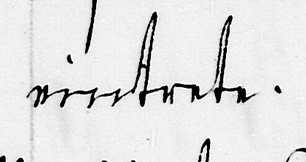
eintrete.
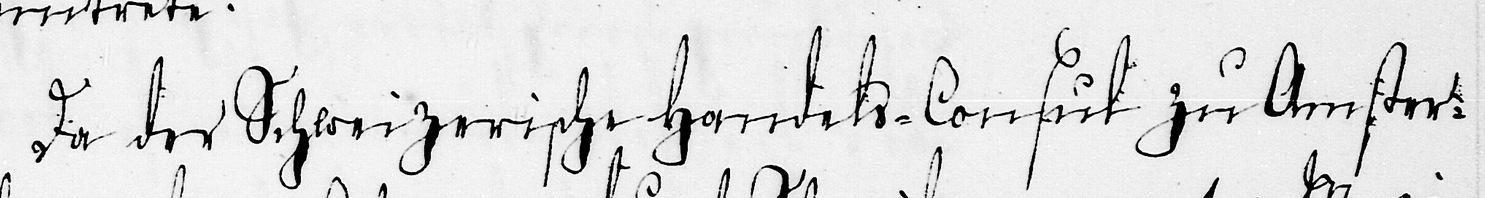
Da der Schweizerische Handels-Consul zu Amster¬
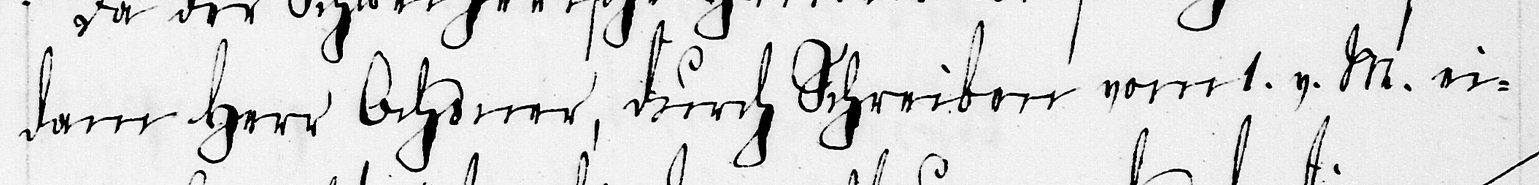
dam Herr Ochsner, durch Schreiben vom 1. v. M. ei¬
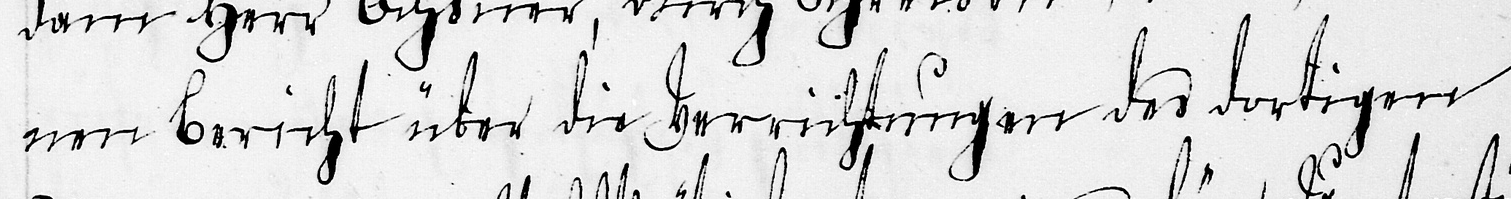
nen Bericht über die Verrichtungen des dortigen
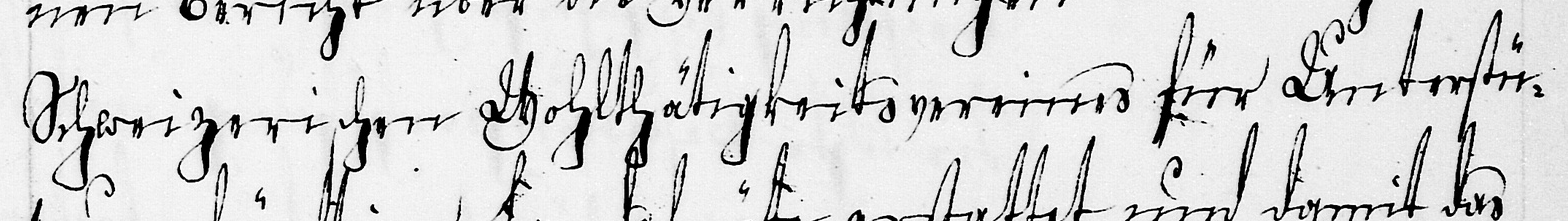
Schweizerischen Wohlthätigkeitsvereines für Unterstü¬
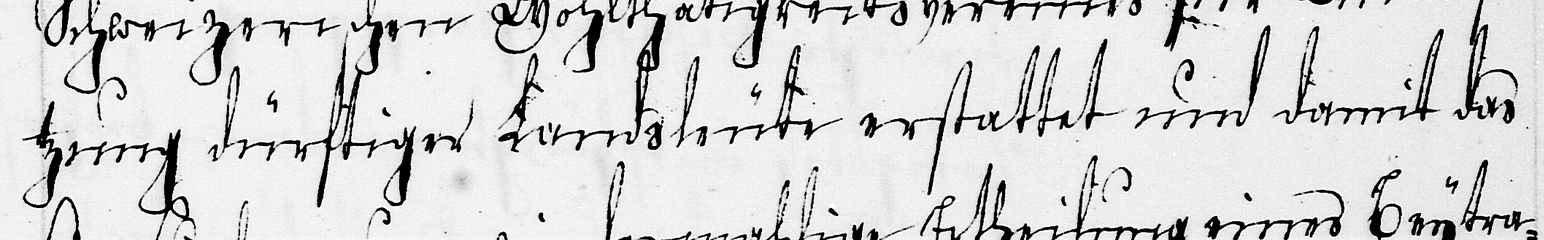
tzung dürftiger Landsleute erstattet und damit das
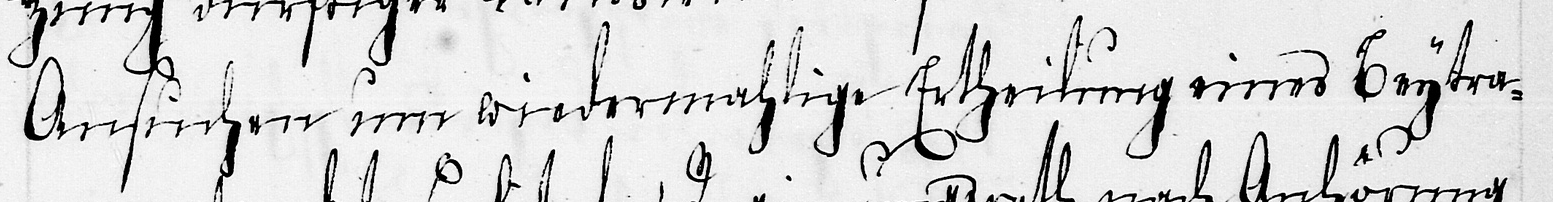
Ansuchen um wiedermahlige Ertheilung eines Beytra¬
